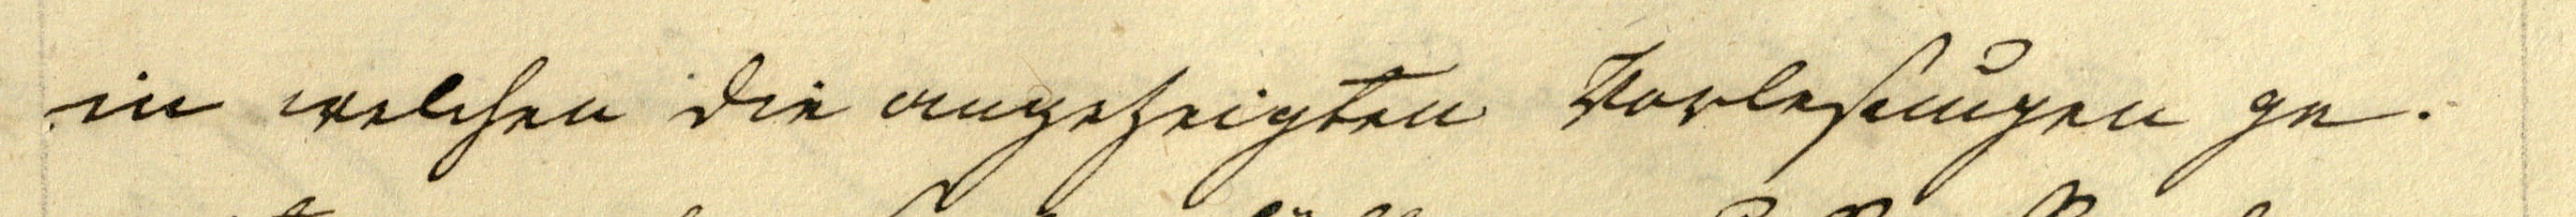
in welchen die angezeigten Vorlesungen ge-
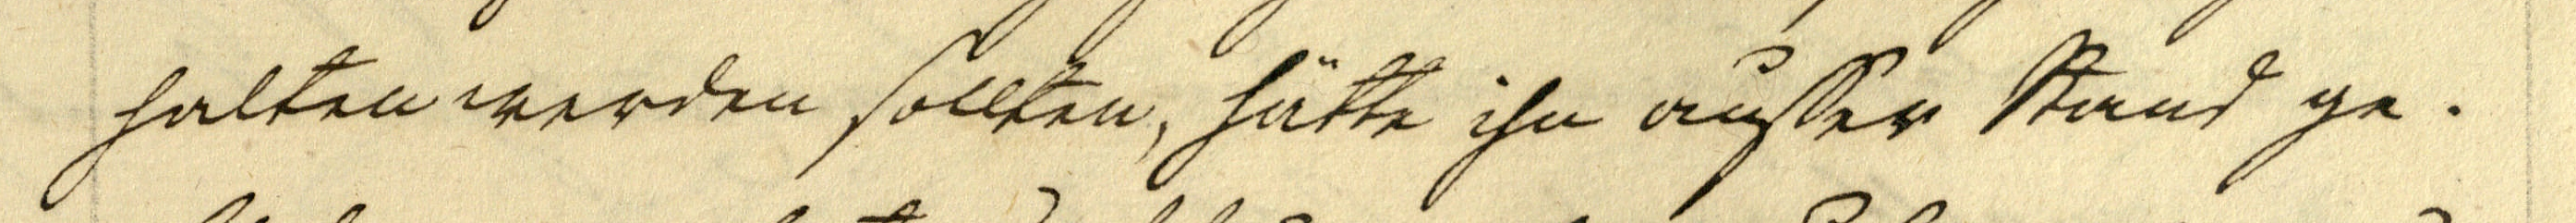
halten werden sollten, hätte ihn ausser Stand ge-
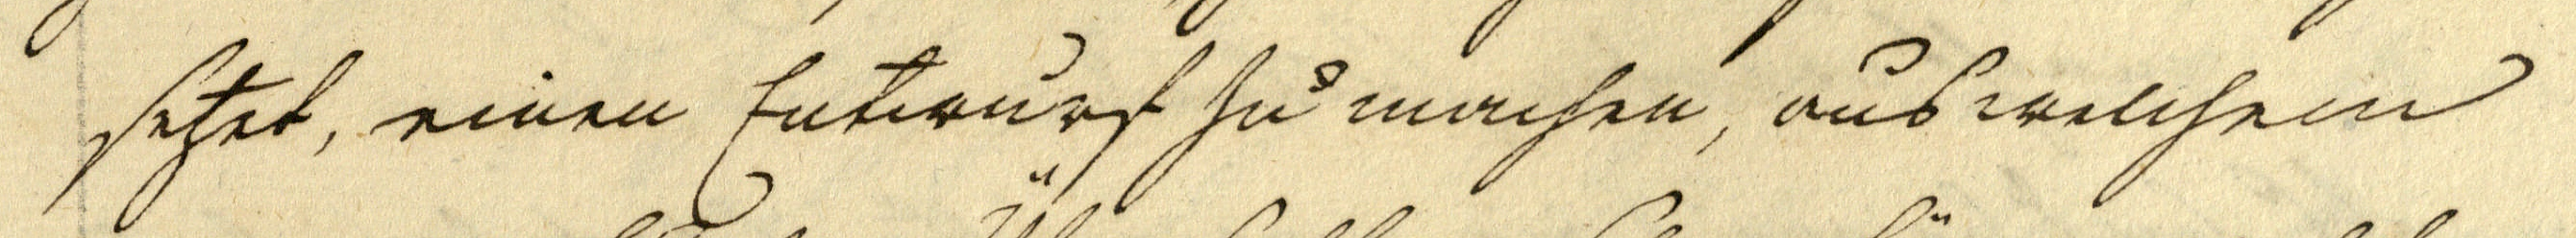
setzet, einen Entwurf zu machen, aus welchem
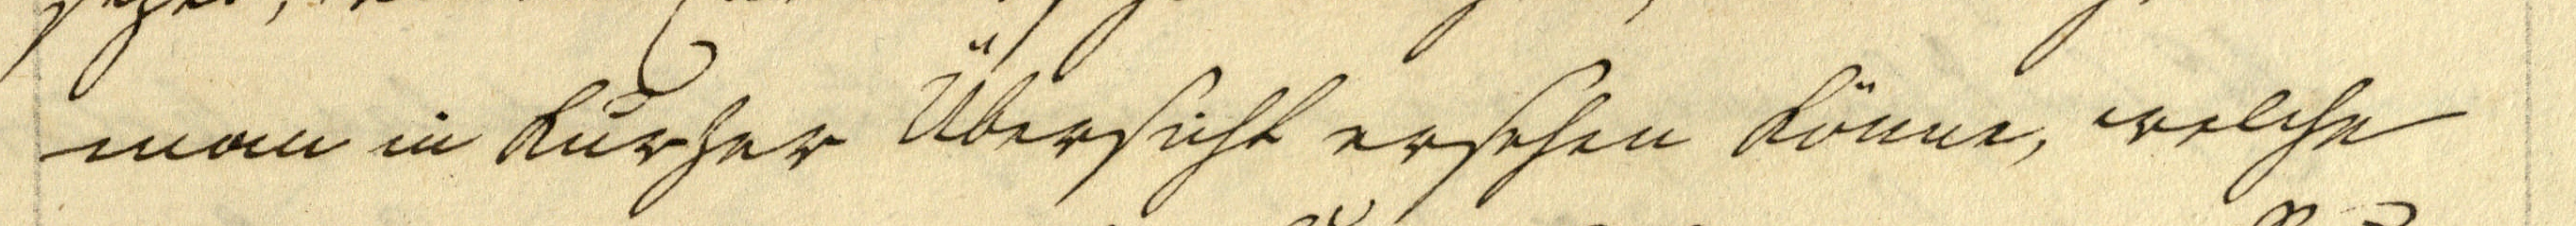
man in kurzer Übersicht ersehen könne, welche
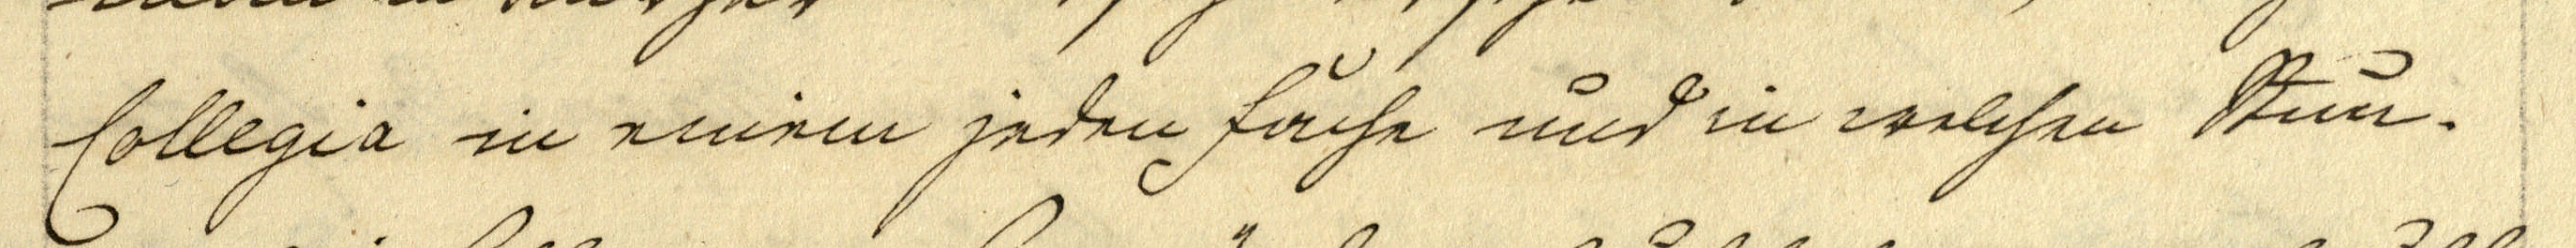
Collegia in einem jeden Fache und in welchen Stun-
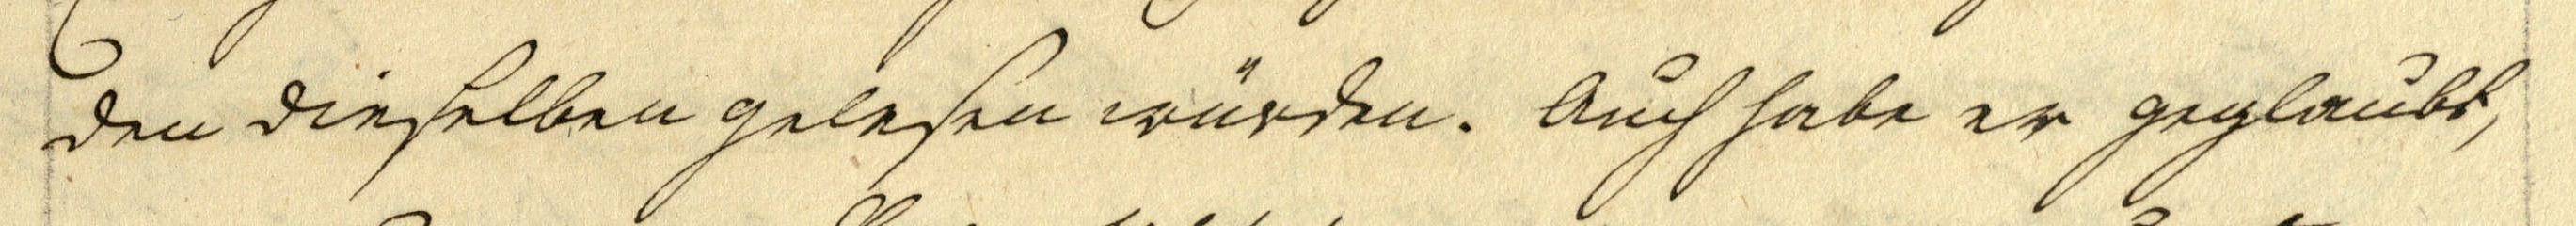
den dieselben gelesen würden. Auch habe er geglaubt,
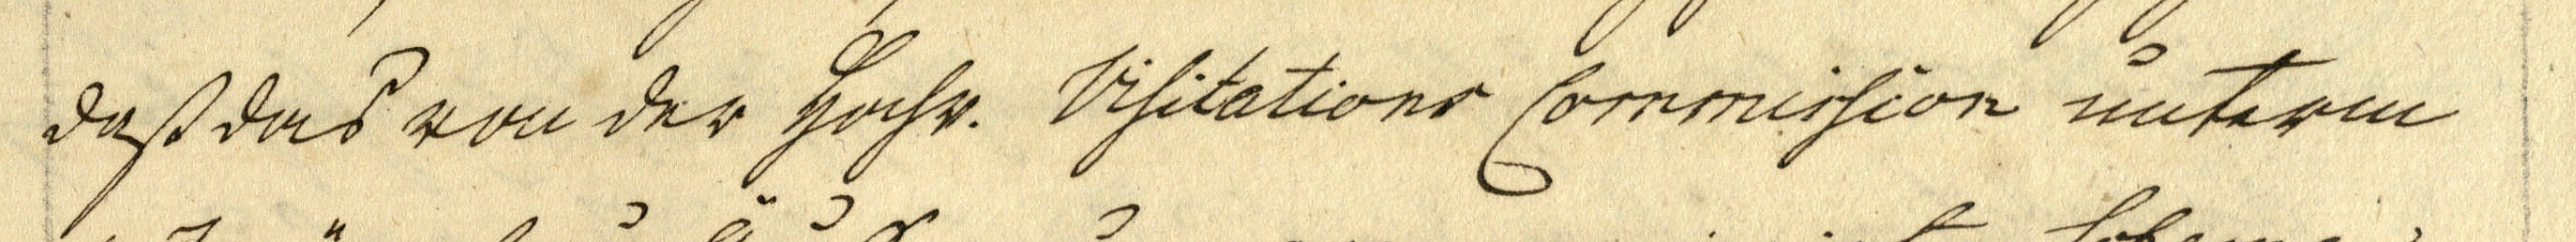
das das von der Hochv. Visitations Commission unterm
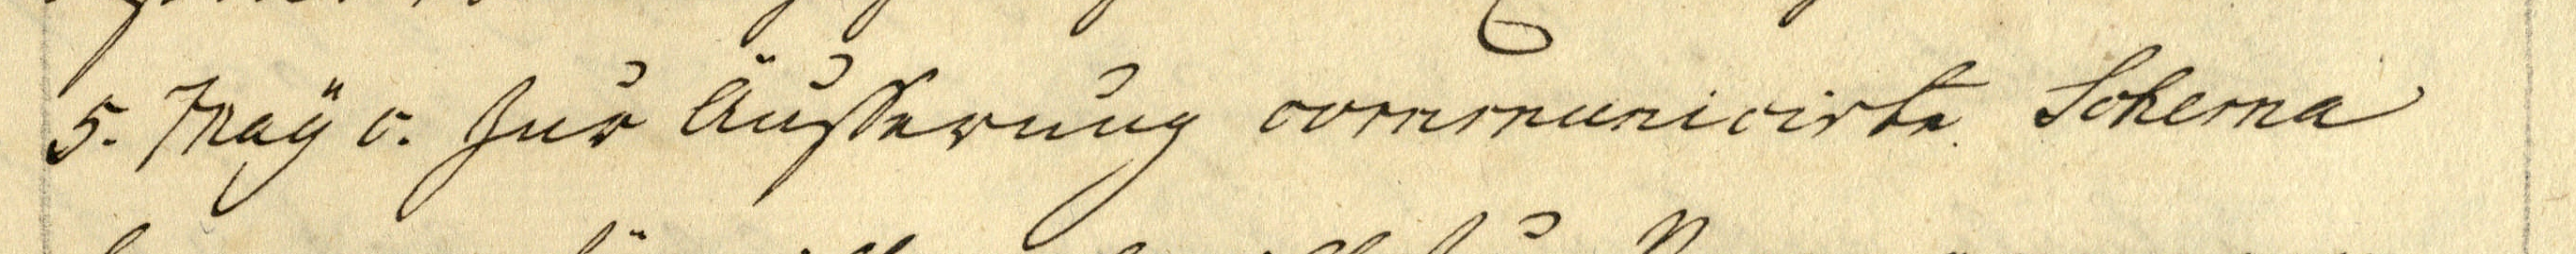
5. May c. Zur Äusserung communicirte Schema
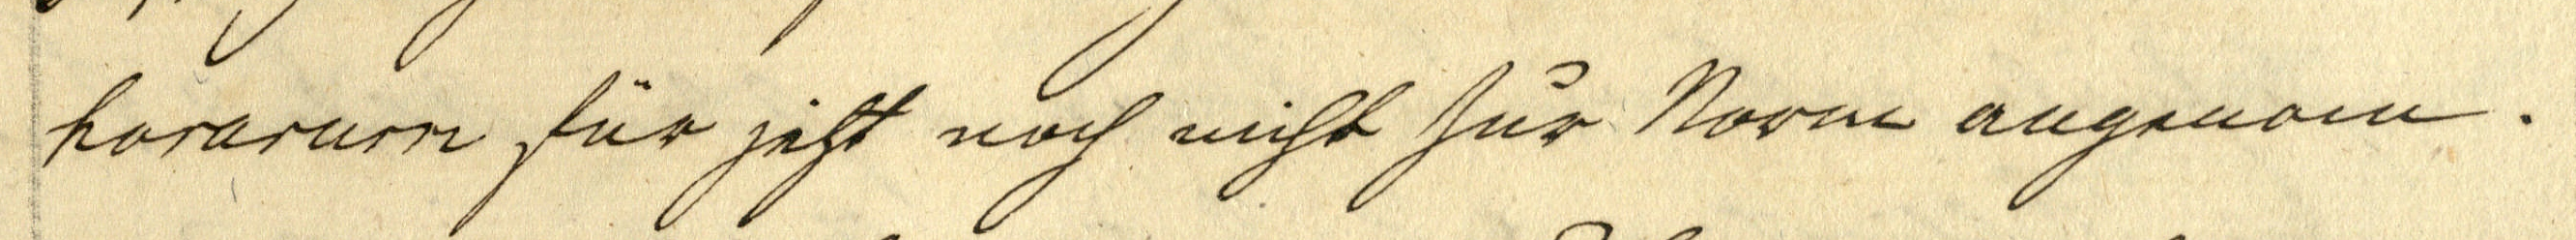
horarum für jetzt noch nicht zur Norm angenom-
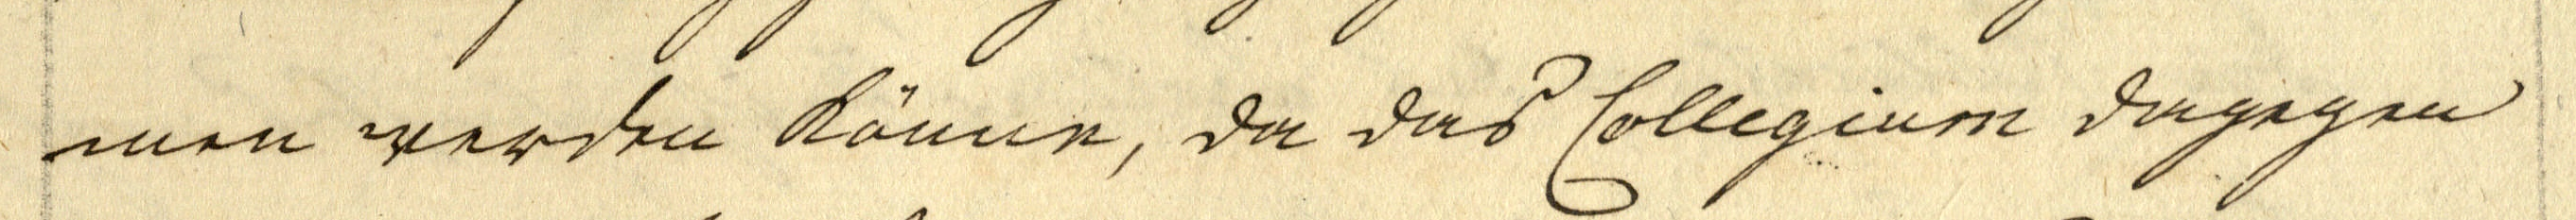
men werden könne, da das Collegium dagegen
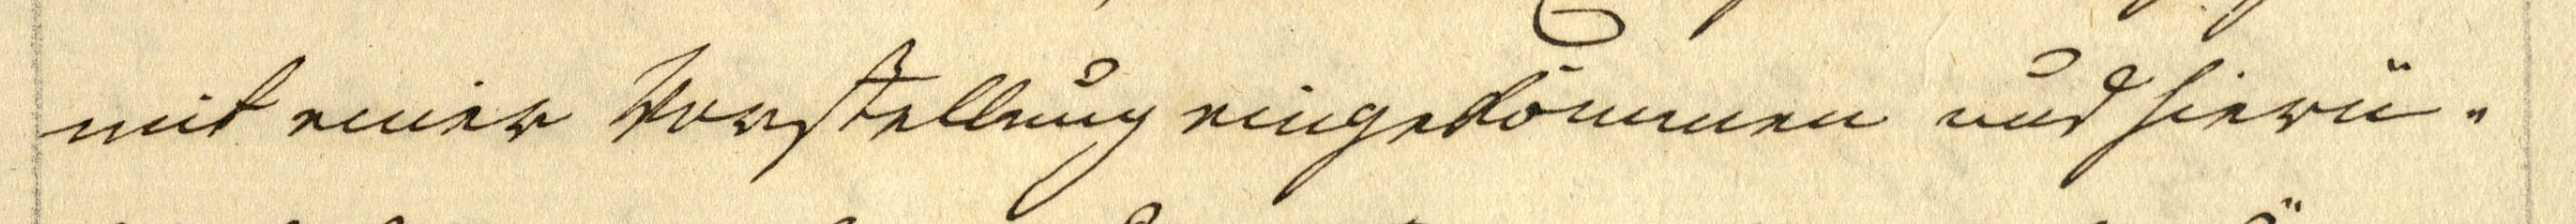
mit einer Vorstellung eingekommen und hierü-
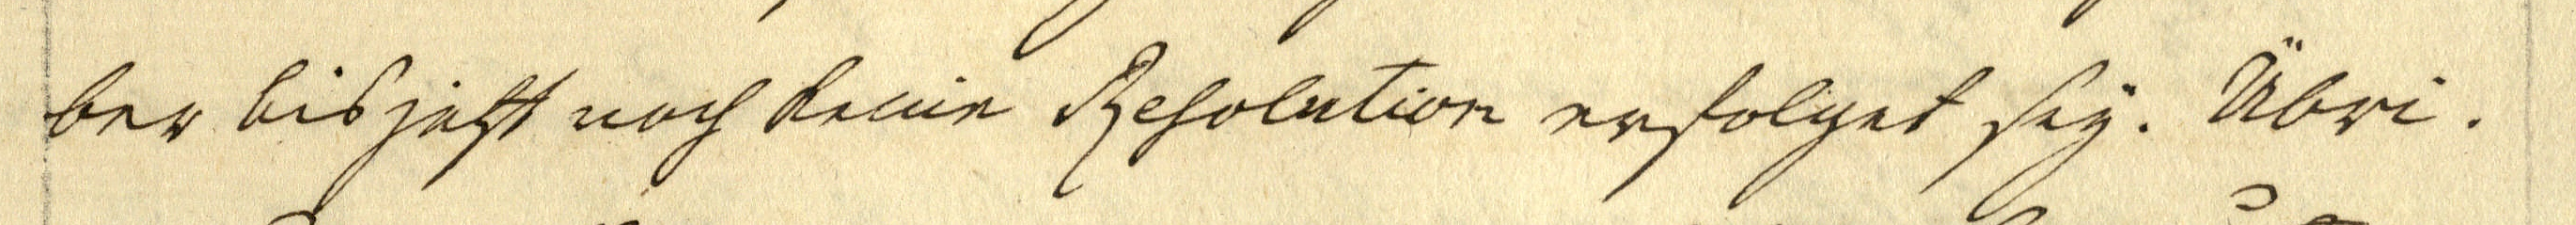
ber bis jetzt noch keine Resolution erfolget sey. Übri-
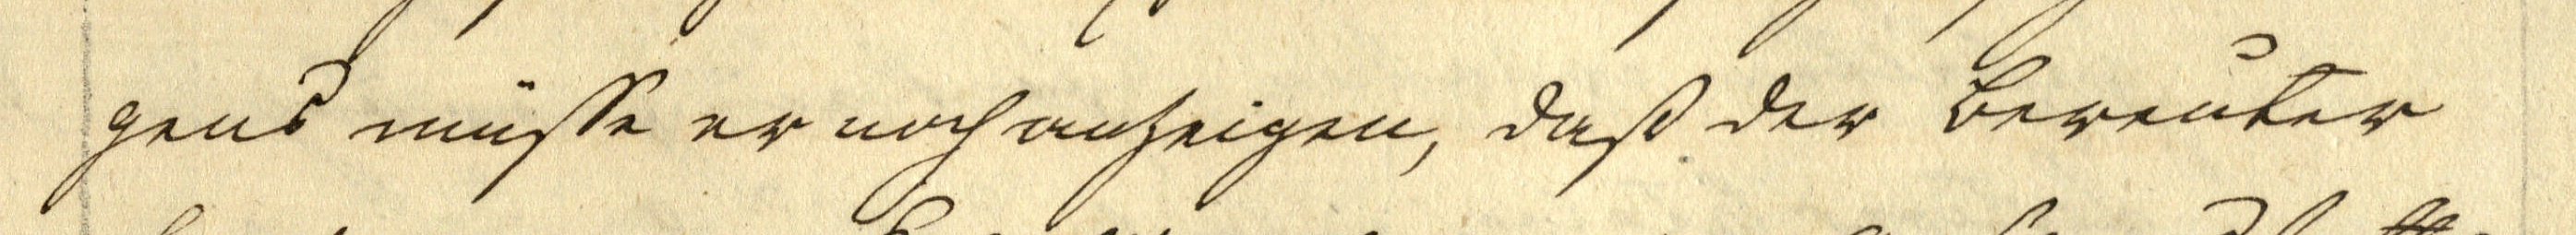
gens müsse er noch anzeigen, daß der Bereuter
